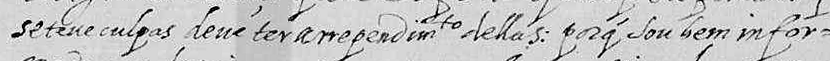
se teue culpas deue ter arrependimto dellas: porq̄ sou bem infor
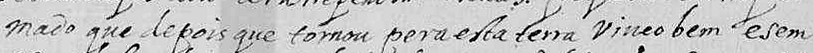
mado que depois que tornou pera esta terra viueo bem e sem
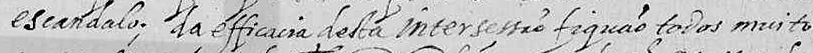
escandalo; da efficacia della intersessaõ fiquaõ todos muito
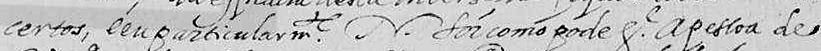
certos, e eu particularmte. N. Sor̄ como pode ge a pessoa de
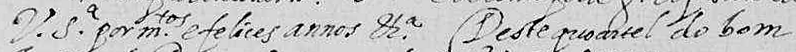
V. S.a por m.tos e felices annos &a. Deste quoartel do bom
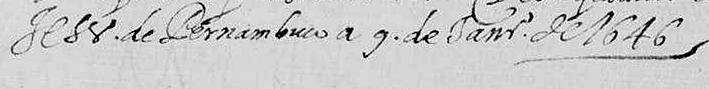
Jesv. de Pernambuco a 9. de Janro. de 1646
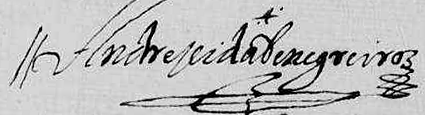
Andre Vidal e negreiros
